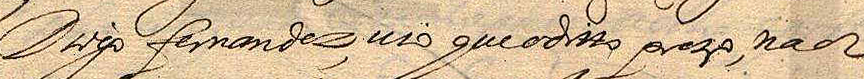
Diogo fernandez, uio que o ditto prezo, naõ
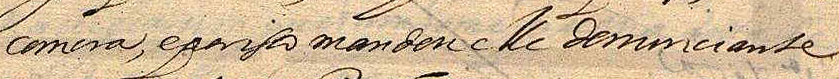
comera, e por isso mandou elle denunciante
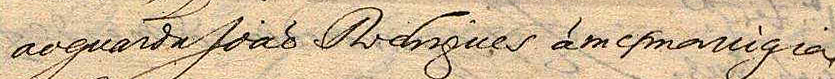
ao guarda Joaõ Rodrigues á mesma uigia,
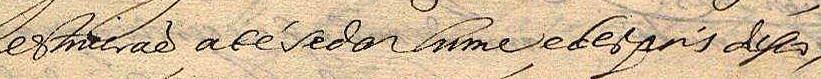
estiueraõ, até se dar lume, e despois disso
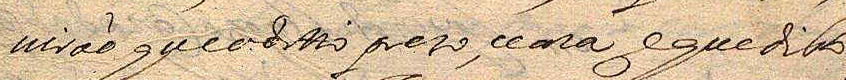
uiraõ que o ditto prezo, ceara e que disto
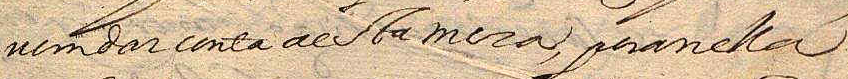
uem dar conta a esta meza, pera nella
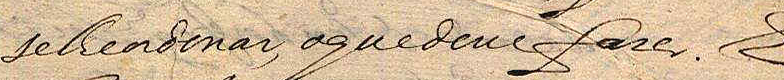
se lhe ordenar, o que deue fazer. E
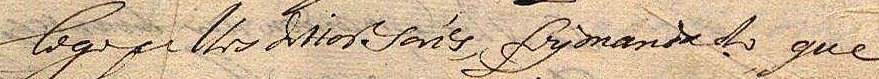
logo pellos dittos sorēs, foy mandado que
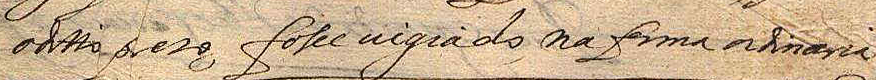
o ditto prezo fosse uigiado na forma ordinaria
